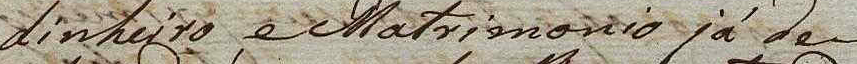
dinheiro, e Matrimonio já de
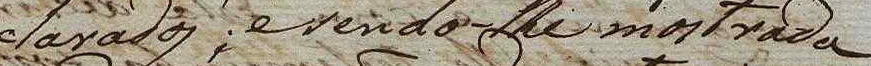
clarados ; e sendo-lhe mostrada
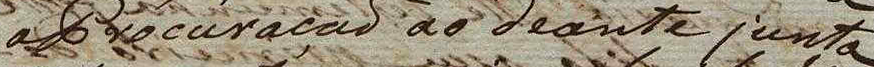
a Procuração aodeante junta
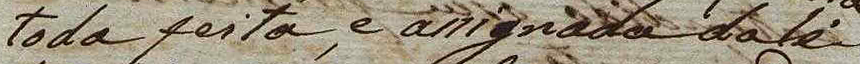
toda feita, e assignada da le
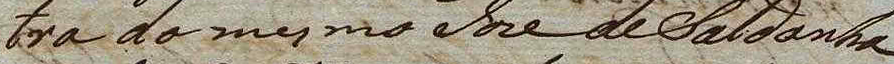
tra do mesmo Ioze de Saldanha
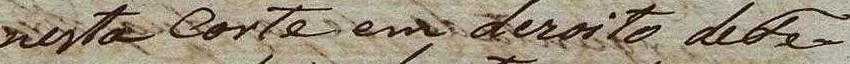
nesta Corte em dezoito de Fe
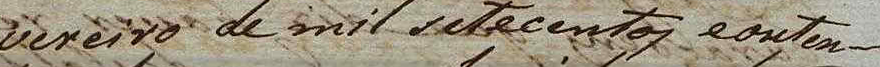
vereiro de mil setecentos e outen
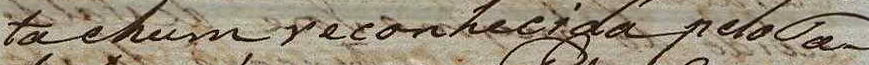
ta e hum, reconhecida pelo Ta
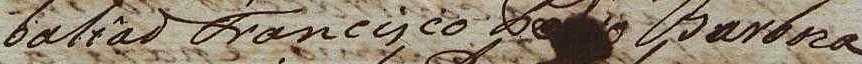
baliaõ Francisco Pe_o Barboza
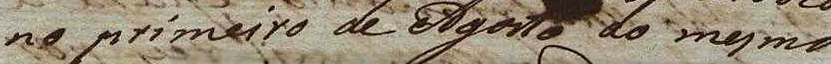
no primeiro de Agosto do mesmo
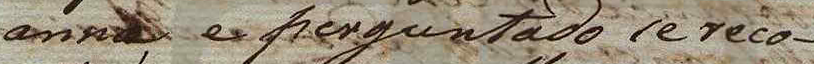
anno, e perguntado se reco
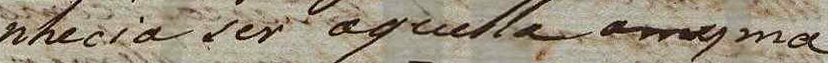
nhecia ser aquella a mesma
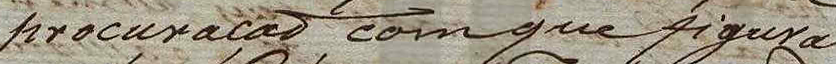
procuraçaõ com que figura
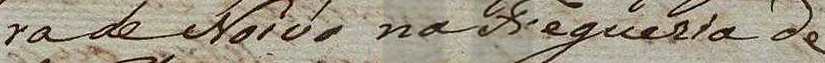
ra de Noivo na Freguezia de
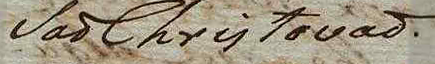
São Christovaõ.
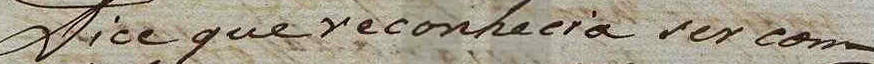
Dice que reconhecia ser com
